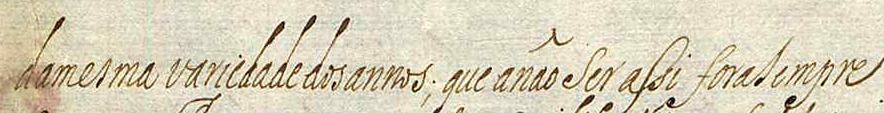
da mesma variedade dos annos; que a naõ ser assi fora sempre
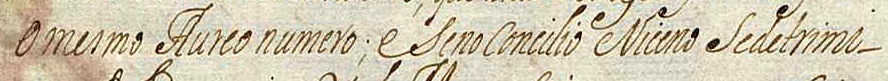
o mesmo Aureo numero; e se no concilio Niceno se detrimi
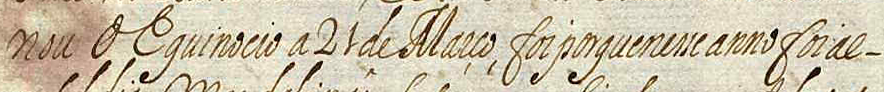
nou O Equinocio a 21 de Março, foi porque nesse anno foi a e
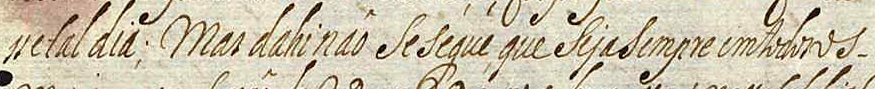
sse tal dia; mas dahi naõ Se segue, que seja sempre em todos os
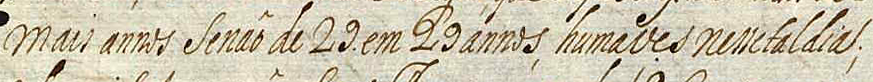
mais annos senaõ de 29. em 29 annos, huma ves nesse tal dia.
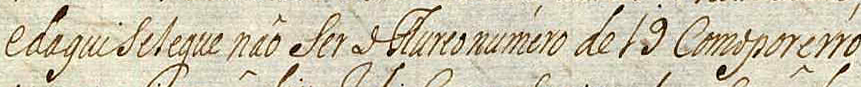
e daqui se segue naõ ser o Aureo numero de 19 Como por erro
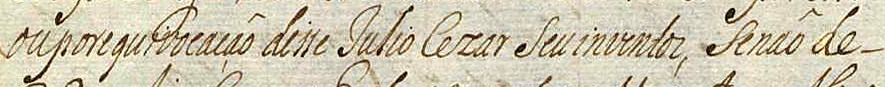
ou por equivocaçaõ disse Iulio Cezar seu inventor, senaõ de
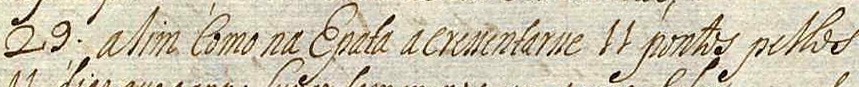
29; asim Como na Epata acressentarsse 11 pontos pellos
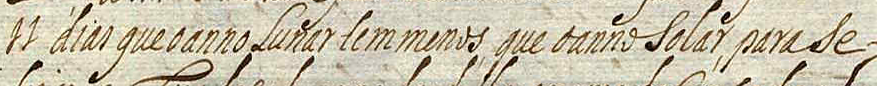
11 dias que o anno Lunar tem menos que o anno Solar, para Se
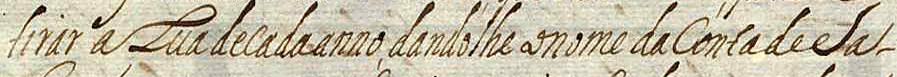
tirar a Lua de cada anno dandolhe o nome da conta de Sa
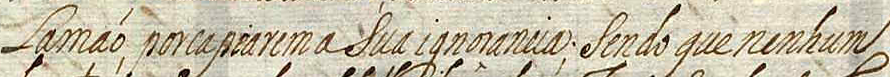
Lamaõ, por captarem a Sua ignorancia; Sendo que nenhum
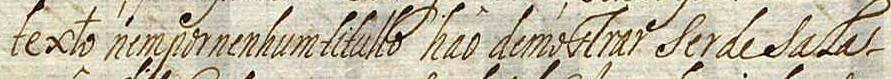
texto nem por nenhum titullo haõ de mostrar ser de SaLa
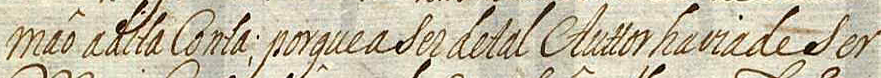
maõ a dita Conta; porque a ser de tal Auttor havia de Ser
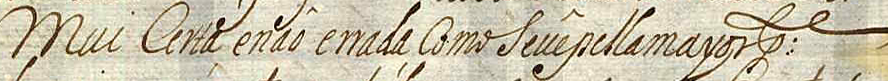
mui Certa, e naõ errada como se uê pella mayor p:te
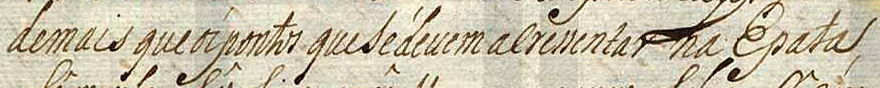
de mais que os pontos que se deuem acressentar na Epata
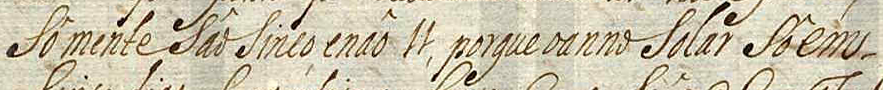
Sómente São Sinco, e naõ 11, porque o anno Solar só em
